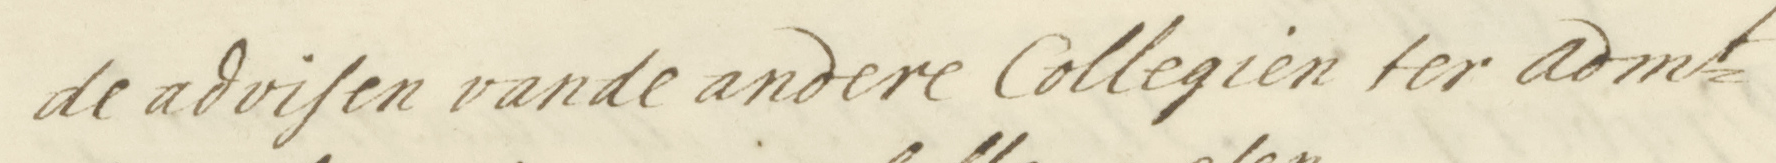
de advisen vande andere Collegien ter Admt.
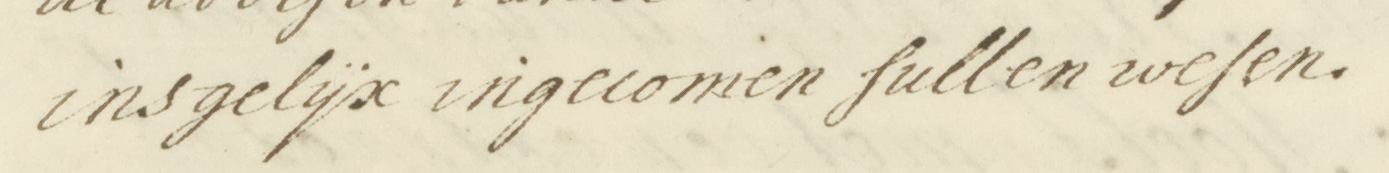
insgelijx ingecomen sullen wesen.
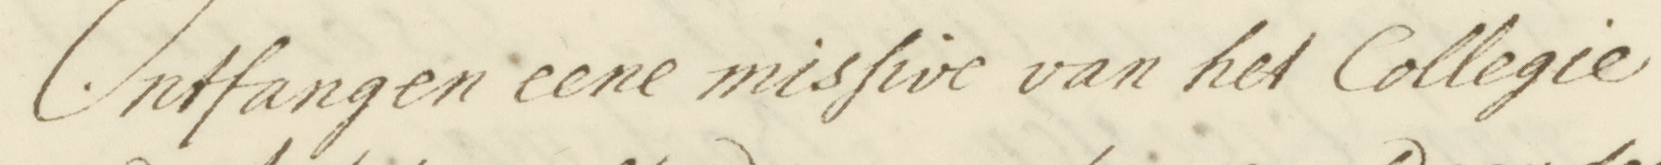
Ontfangen eene missive van het Collegie
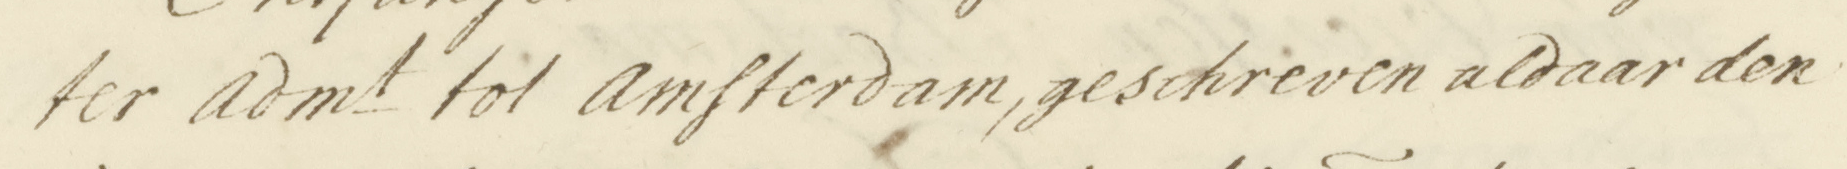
ter Admt. tot Amsterdam, geschreven aldaar den
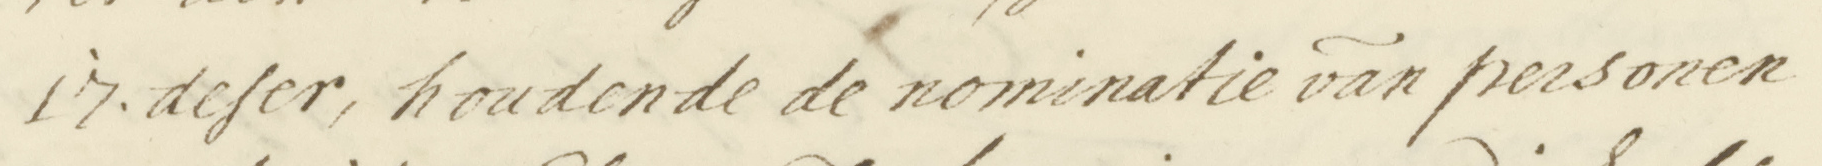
17. deser, houdende de nominatie van personen
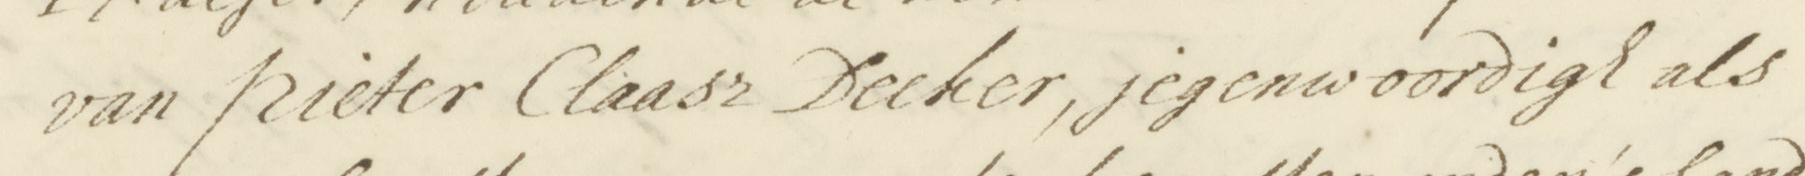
van Pieter Claasz Decker, jegenwoordigh als
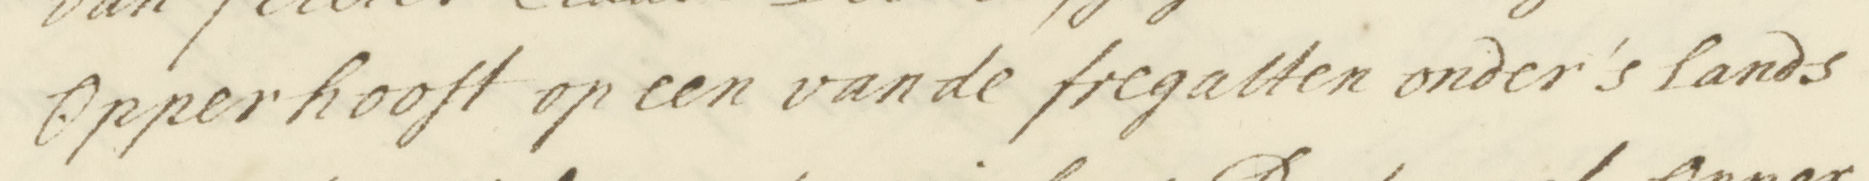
opperhooft op een van de fregatten onder 's lands
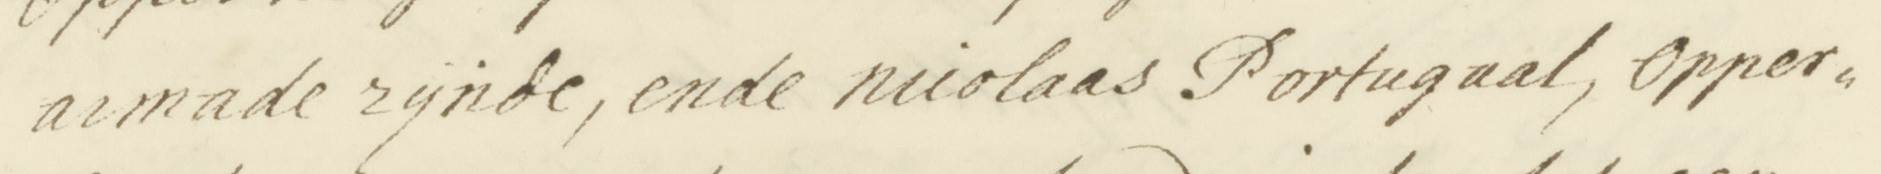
armade zijnde, ende nicolaas Portugaal, Opper„
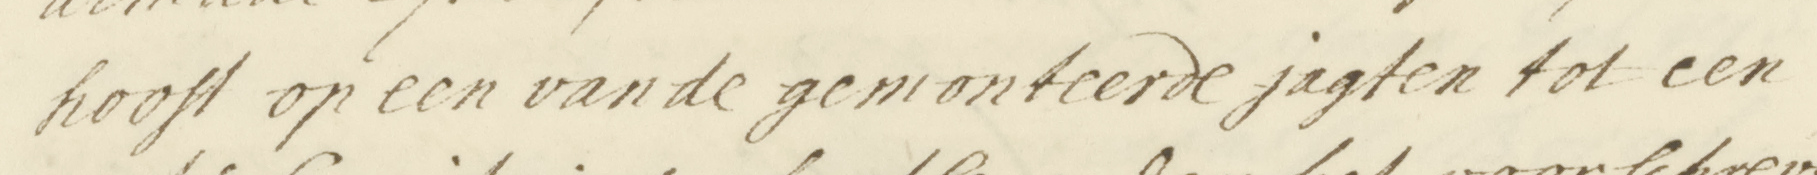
hooft op een van de gemonteerde jagten tot een
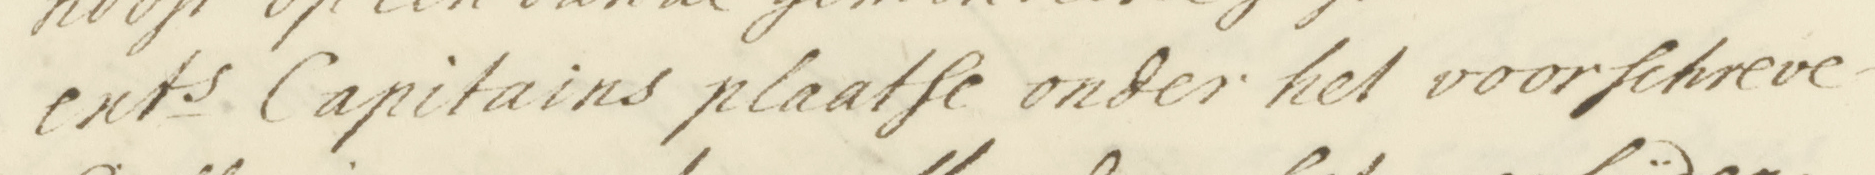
exts. Capitains plaatse onder het voorschreve
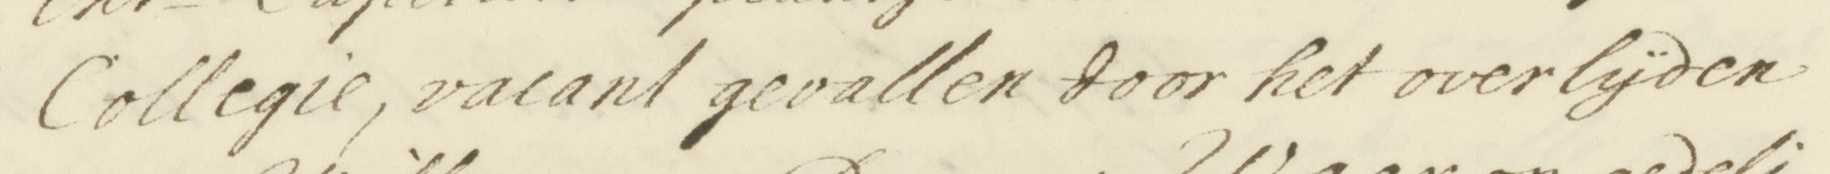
Collegie, vacant gevallen door het overlijden
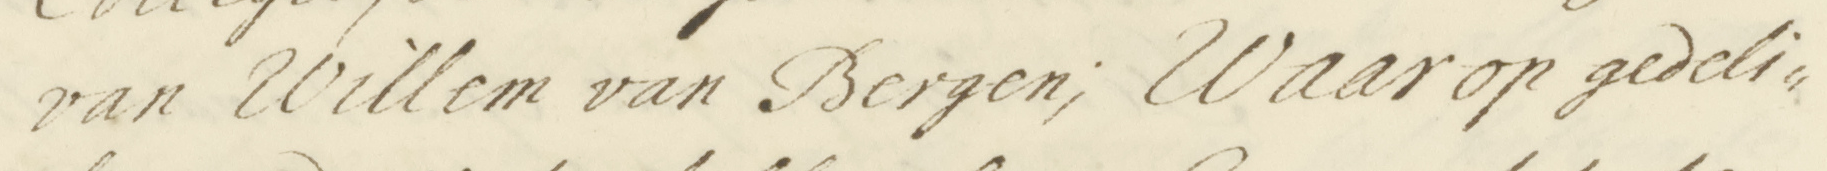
van Willem van Bergen; Waarop gedeli„
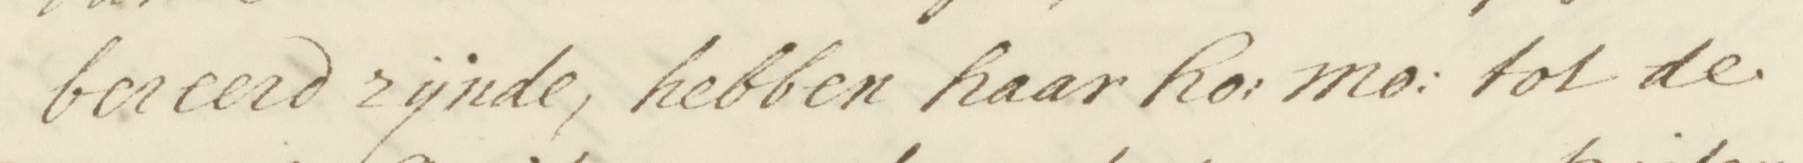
bereerd zijnde, hebben haar Ho:Mo: tot de
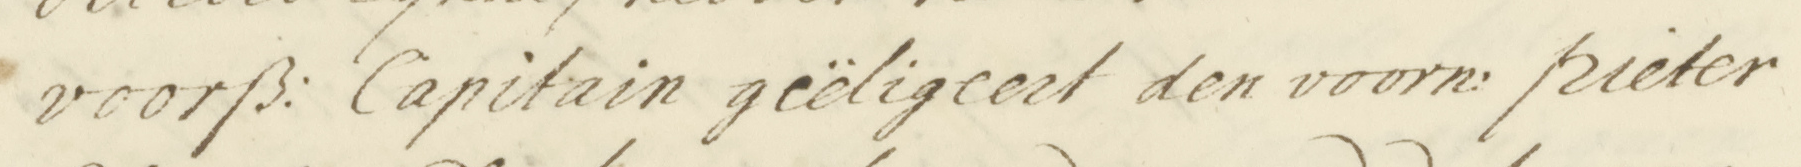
voors: Capitain geëligeert den voorn: Pieter
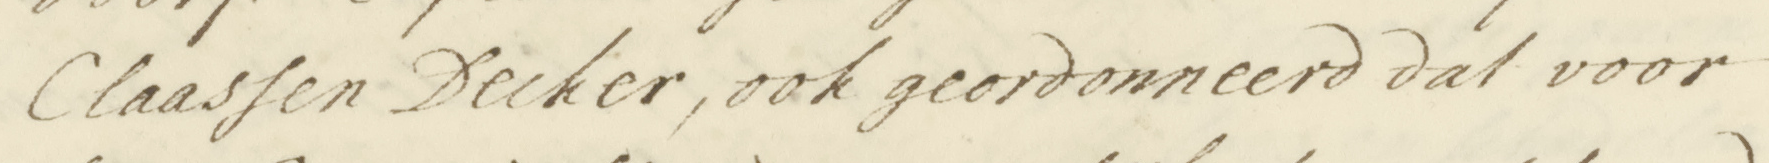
Claassen Decker, ook geordonneerd dat voor
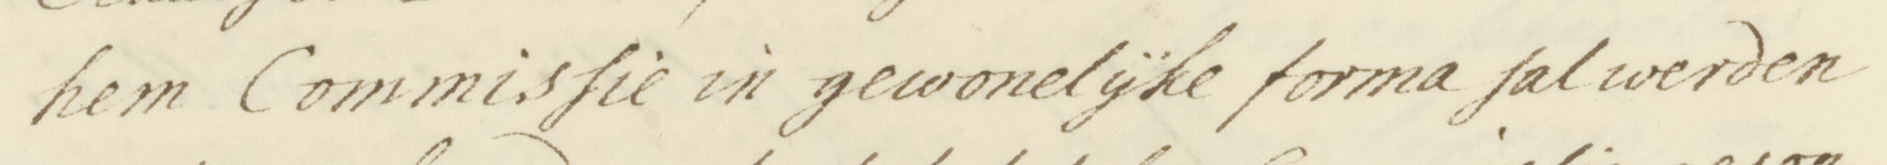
hem Commissie in gewonelijke forma sal werden
